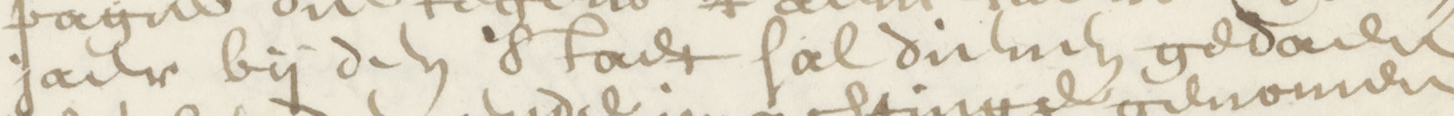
jaer bij den Staet sal dienen gedaen
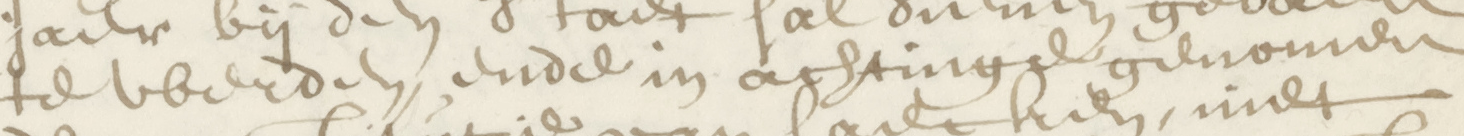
te werden, ende in achtinge genomen
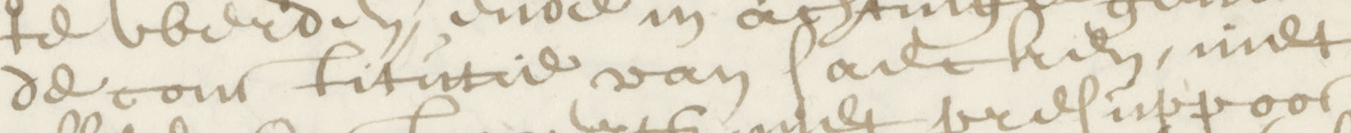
de constitutie van saecken, niet
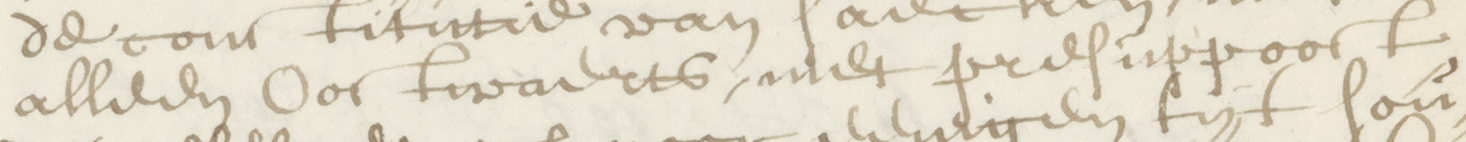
alleen Oostwaerts, met presuppoost
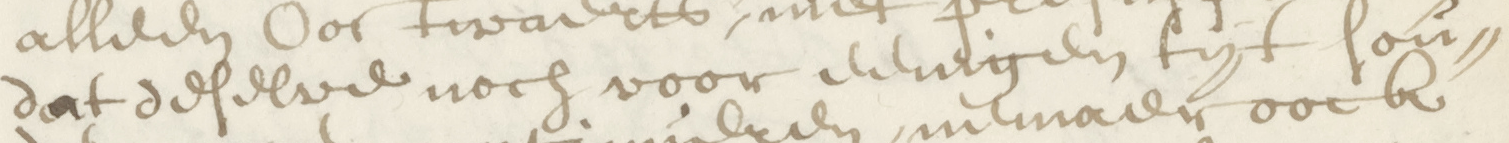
dat deselve noch voor eenigen tijt sou,,
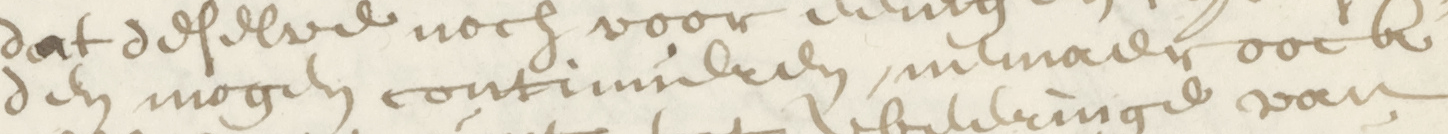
den mogen continueren, nemaer oock
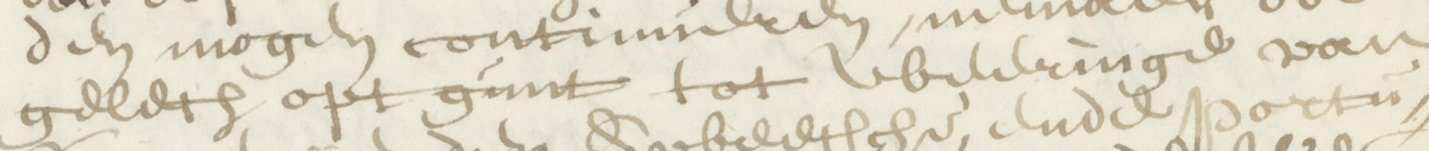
geleth opt gunt tot weeringe van
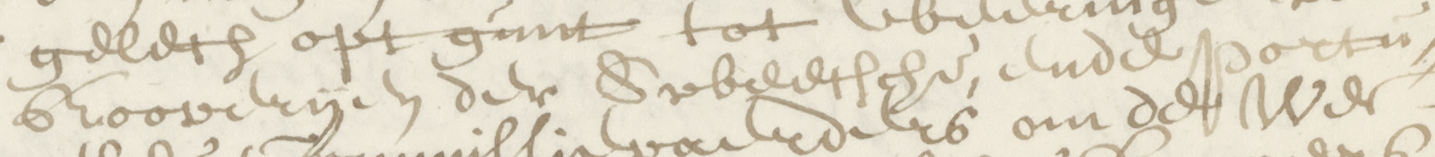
Rooverijen der Sweetsche, ende portu,,
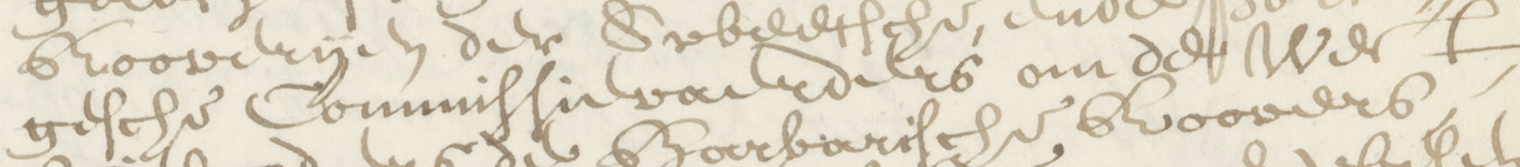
gesche Commissievaerders om de West,
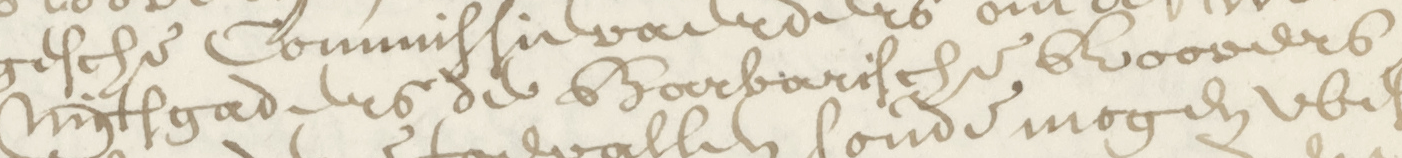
mitsgaders de Barbarische Roovers,
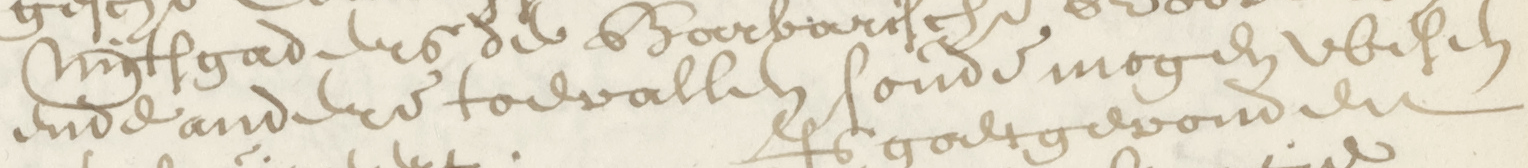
ende andere toevallen soude mogen wesen
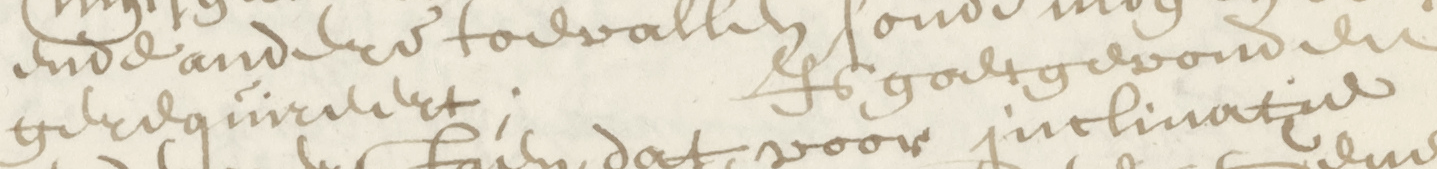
gerequireert; Is goetgevonden
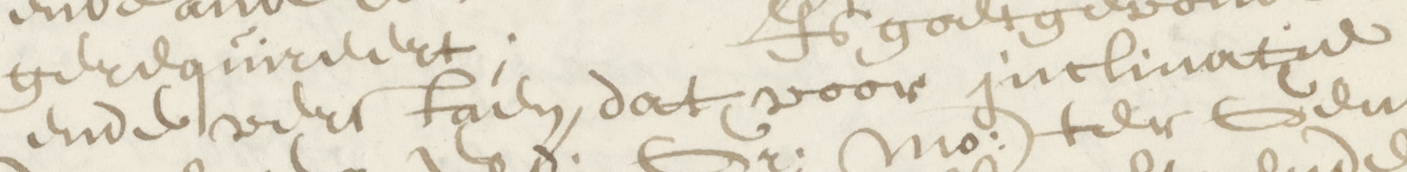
ende verstaen, dat voor inclinatie
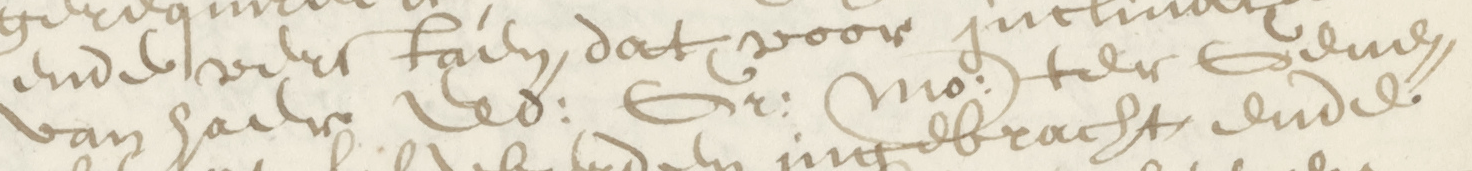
van haer Ed:Gr:Mo: ter Gene,,
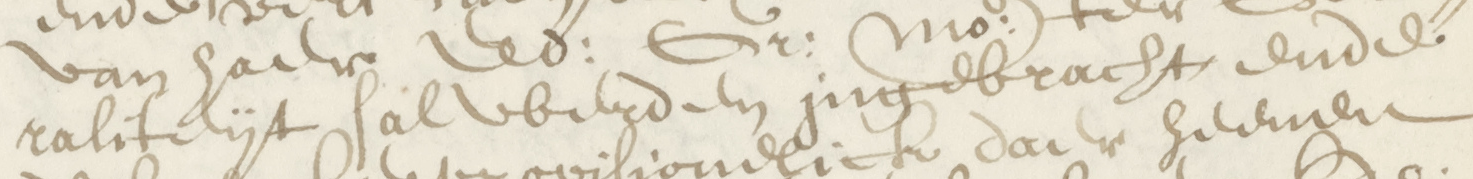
raliteijt sal werden ingebracht, ende
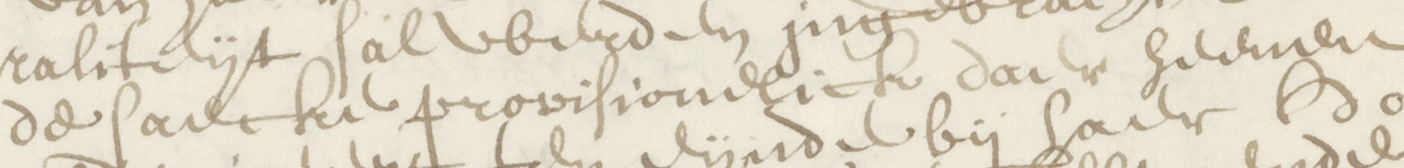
de saecke provisionelick daer heenen
